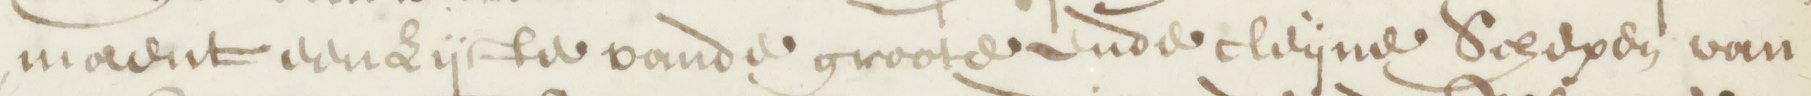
„maent een Lijste vande groote ende cleijne Schepen van
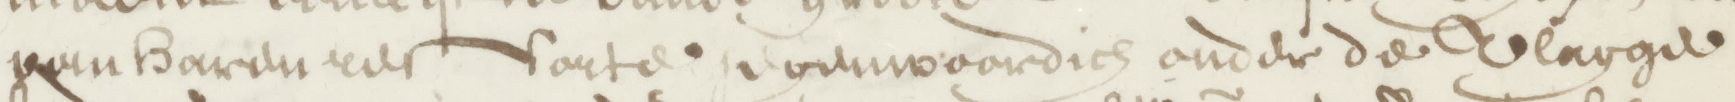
van haren ressorte jegenwoordich onder de Vlagge
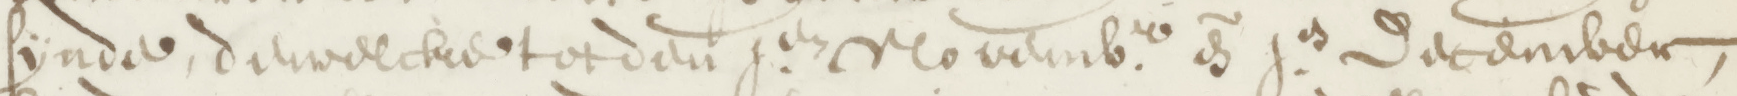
sijnde, dewelcke tot den 1en. Novembr. en 1en. December,
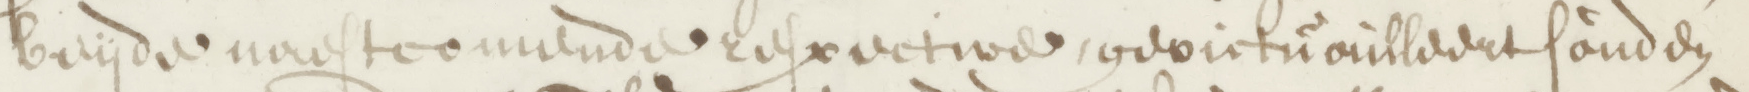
beijde naestcomende respective, gevictuailleert souden
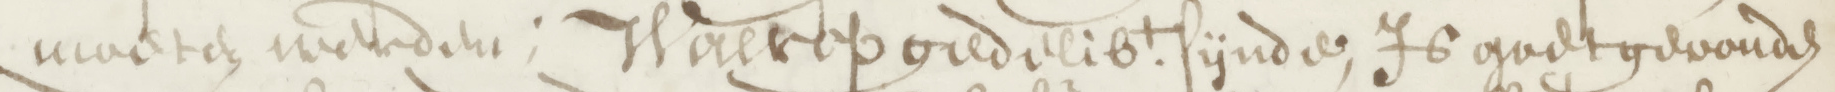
moeten werden; Waerop gedelibt. sijnde, Is goetgevonden
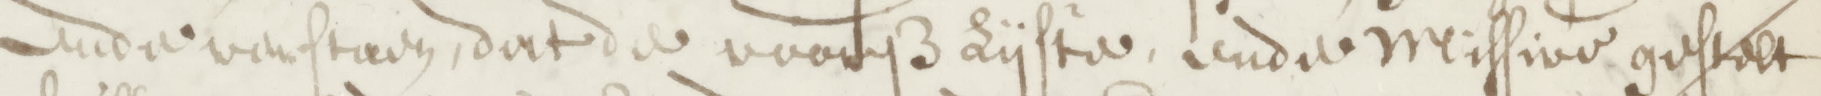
ende verstaen, dat de voors Lijste, ende Missive gestelt
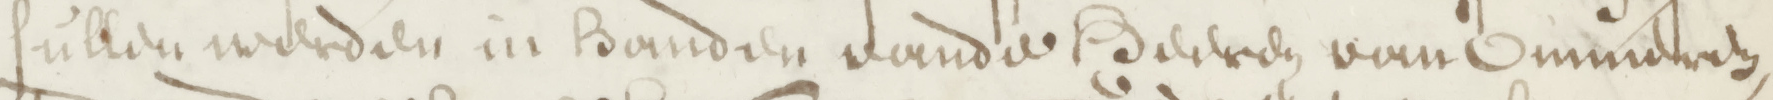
sullen werden in handen vande Heeren van Ommeren,
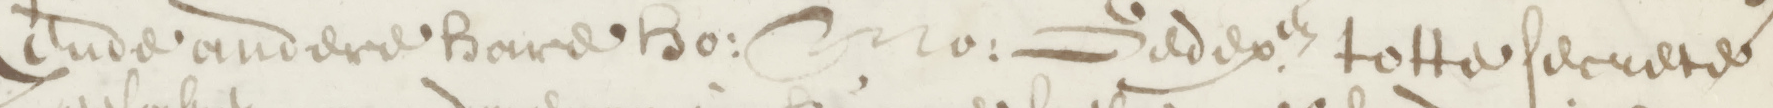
ende andere hare Ho:Mo: Gedepen. totte secrete
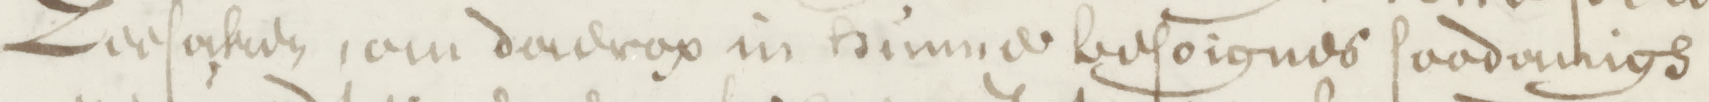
Zeesaken, om daerop in hunne besoignes soodanigh
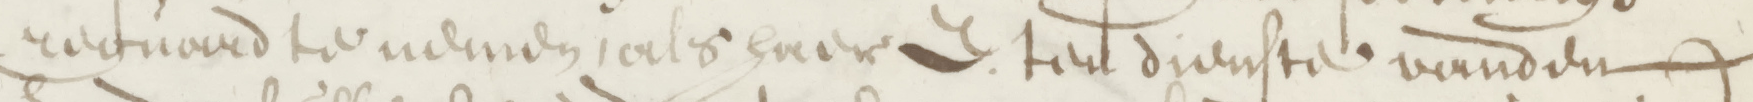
reguard te nemen, als haer E. ten dienste vanden
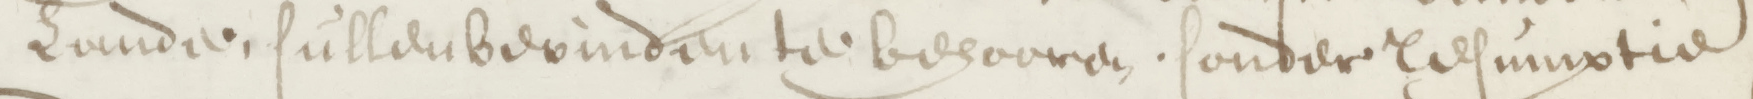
Lande, sullen bevinden te behooren, sonder Resumptie
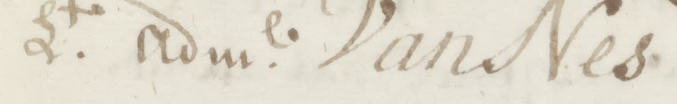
Lt. Adml. Van Nes.
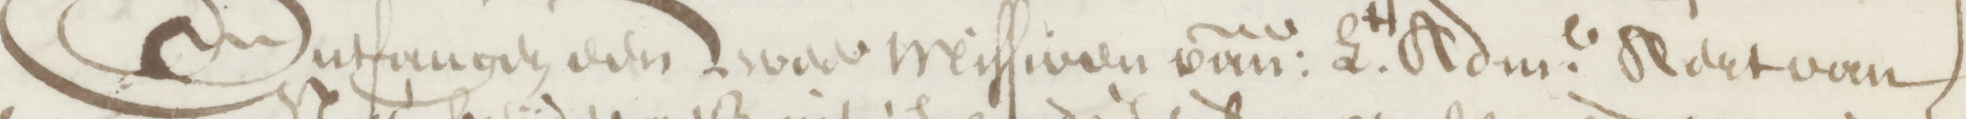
Ontfangen een twee Missiven van: Lt. Adml. Aert van
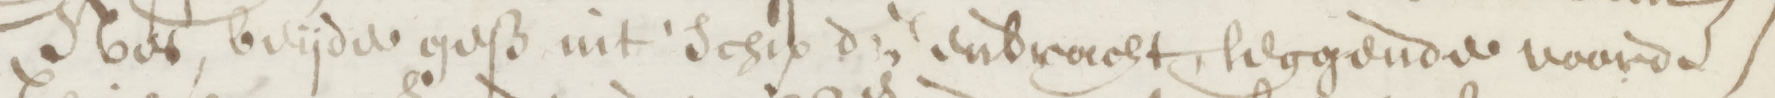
Nes, beijde ges int' Schip d‛Eendracht, leggende voorde
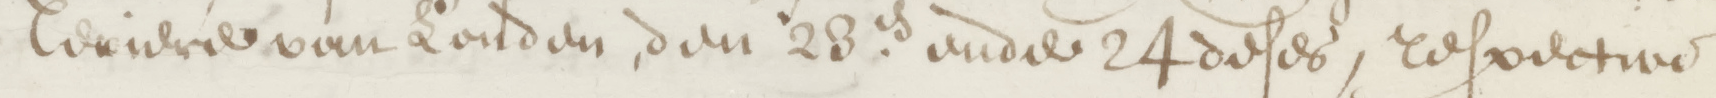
Reviere van Londen, den 23en. ende 24 deses, respective
